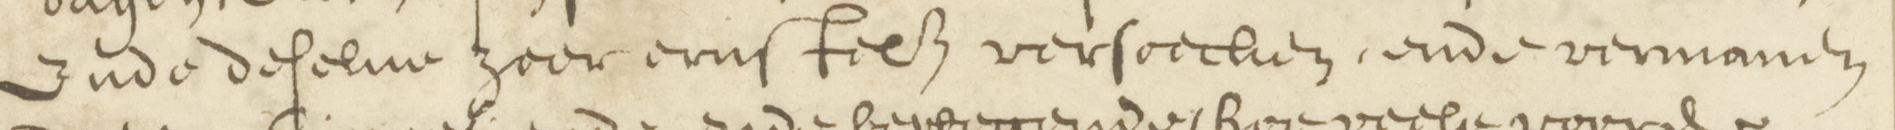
Ende deselue zeer ernstel versoecken, ende vermanen
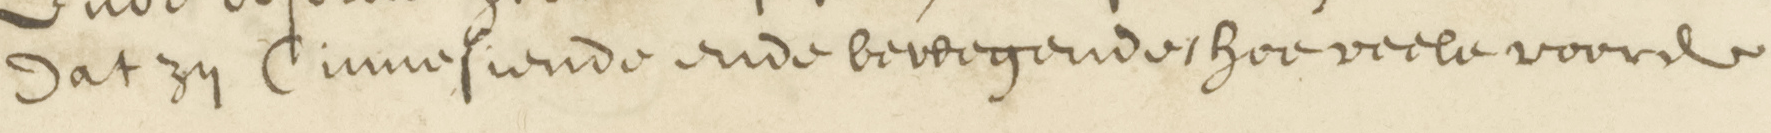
Dat zy (innesiende ende bewegende, hoe veele voorde
